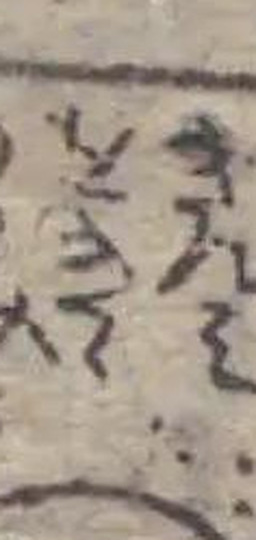をきゝ
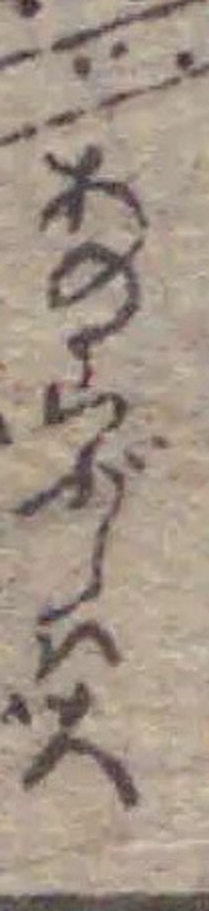あの山ぶしは大
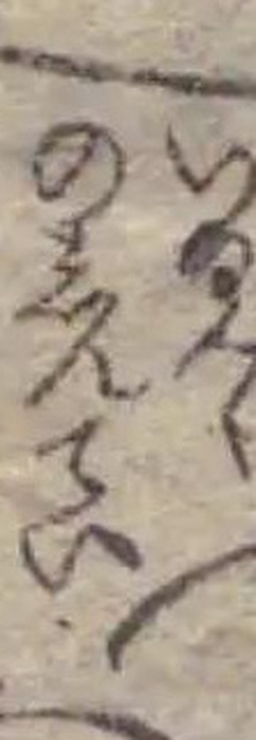のしんてい
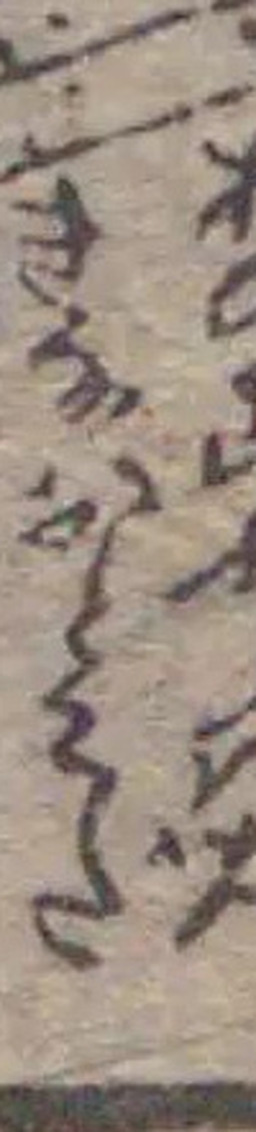きなおとこだ
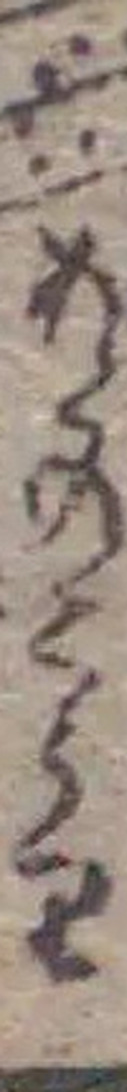あとのこうり
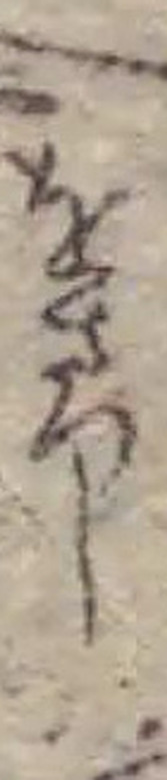をさつし
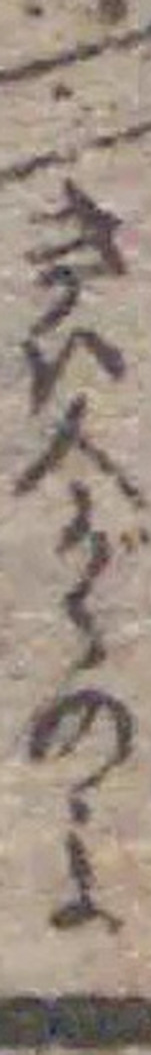きは人がらのよ
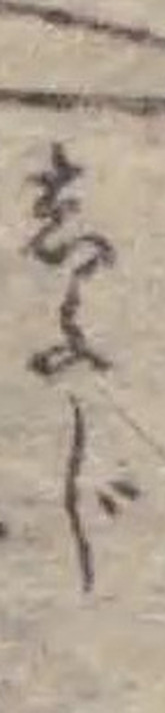しよじ
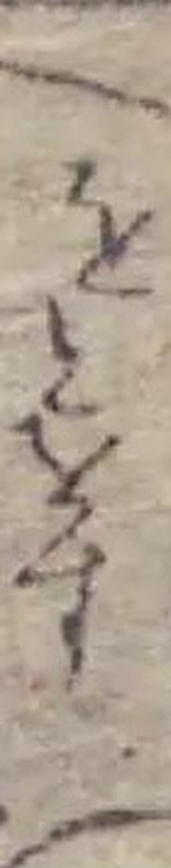をとをす
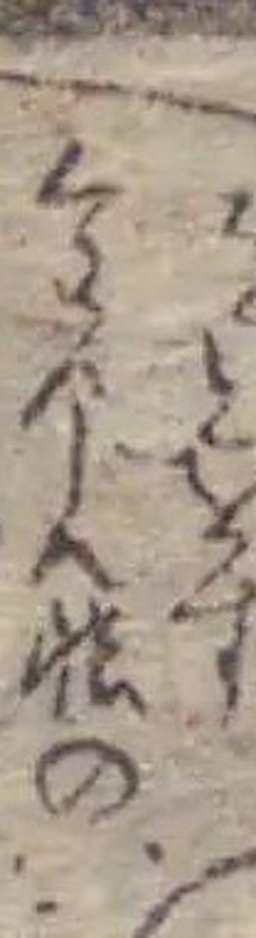くわんじん帳の
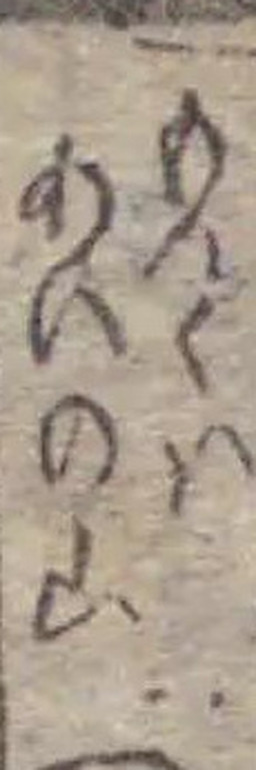あいの山
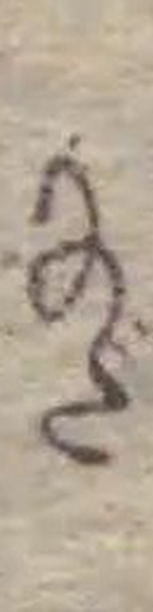ものだ

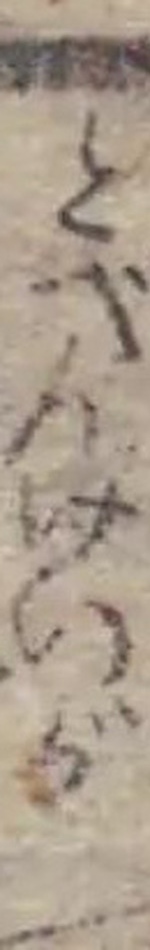とべんけいが
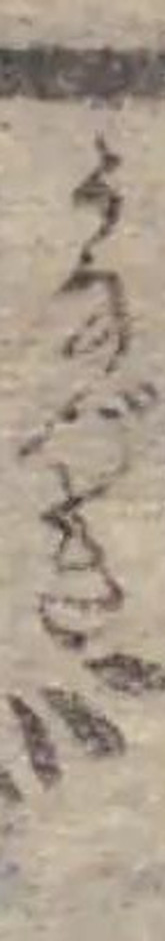うなづき
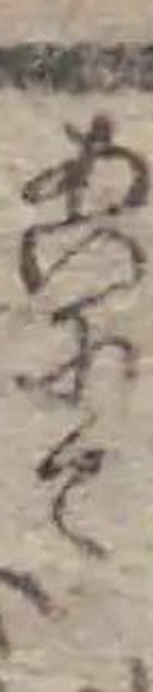あいにて
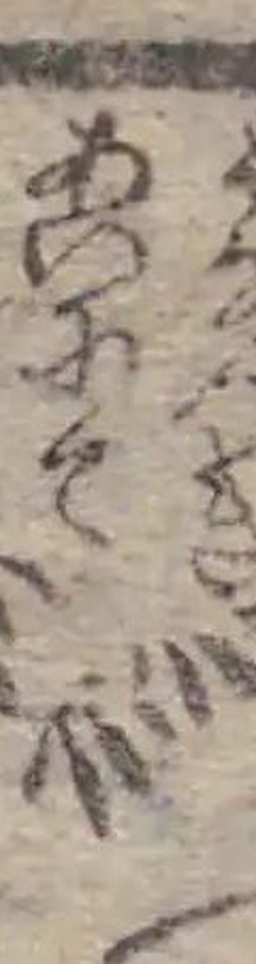あいにて
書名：通増安宅関 2巻
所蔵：国立国会図書館 National Diet Library, JAPAN
